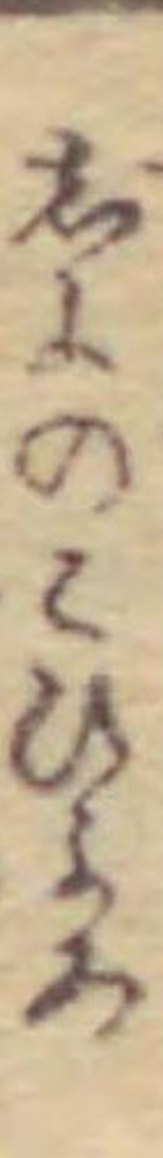しよのこひよろ
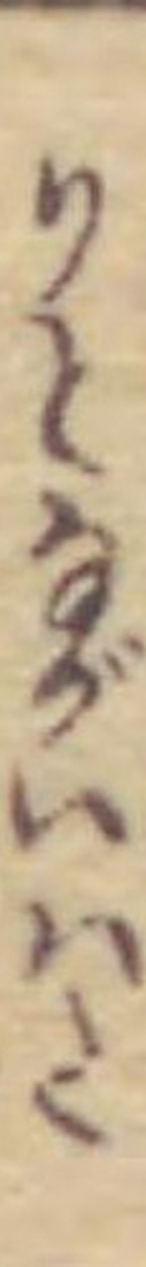りとながいはた
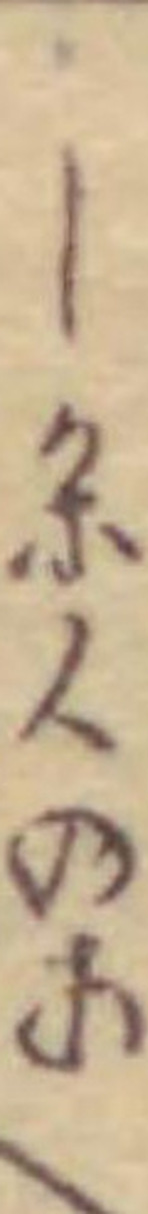しかに人のあ
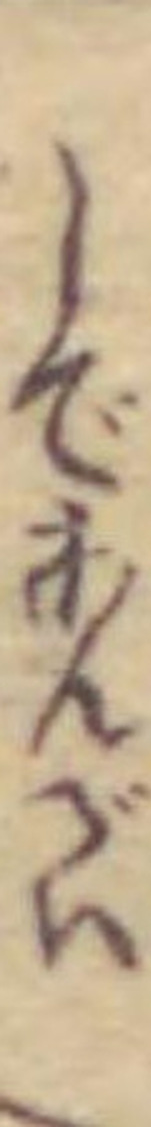しであんがい
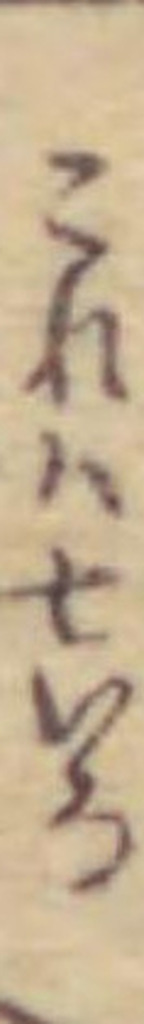これは七いろ
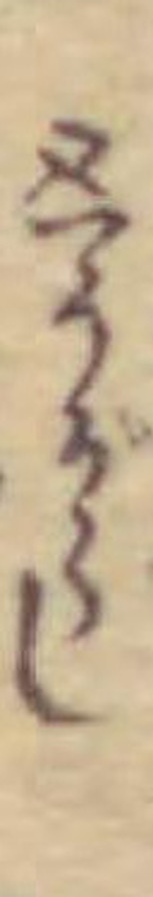とうがらし
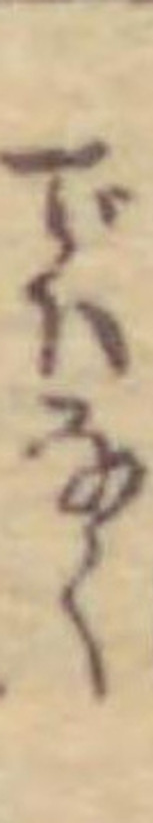ではなく
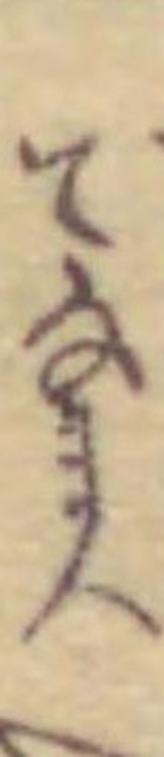てなまへ
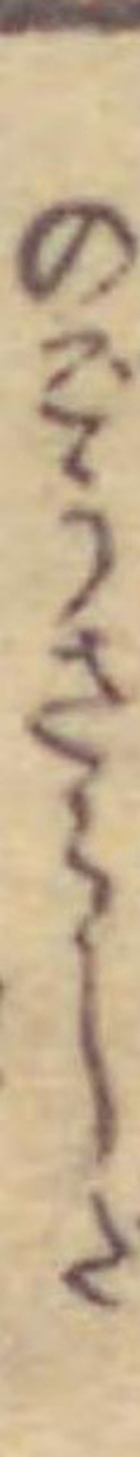のごうさらしに
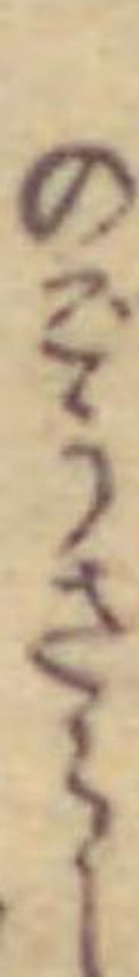のごうさらしに
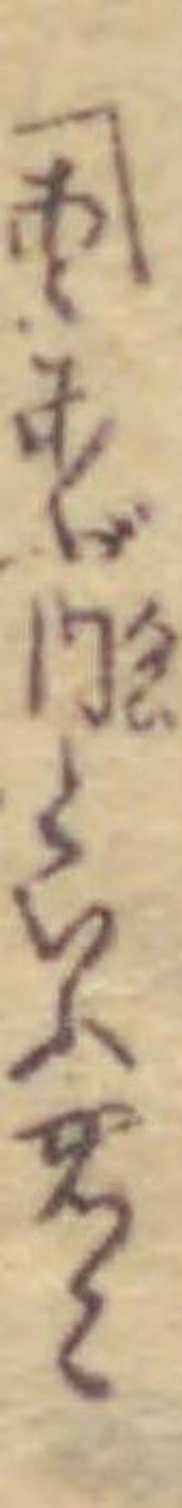〽あゝあぶ内といふやつと
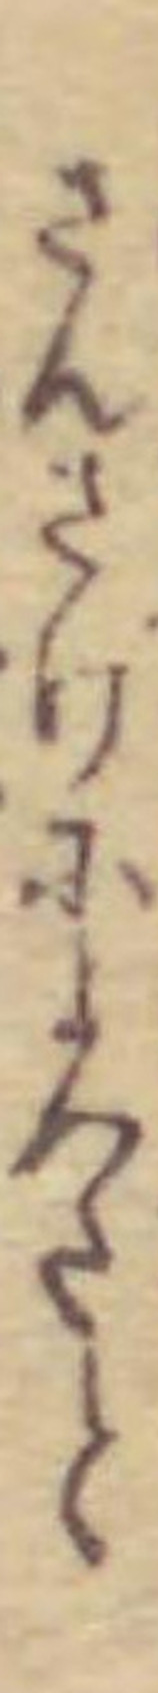さんさけによつたと
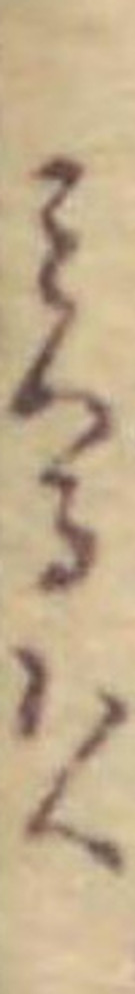みへるはへ
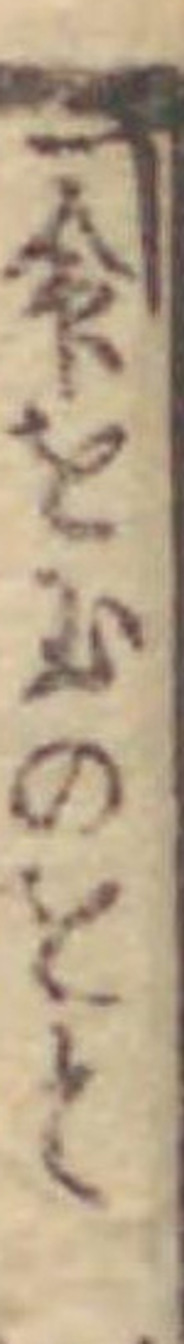〽命を玉のをそ
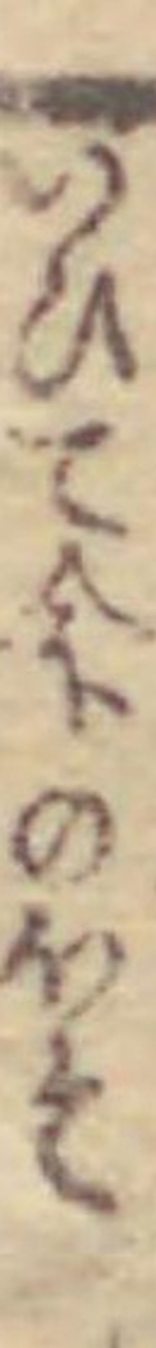いひて命のほそ
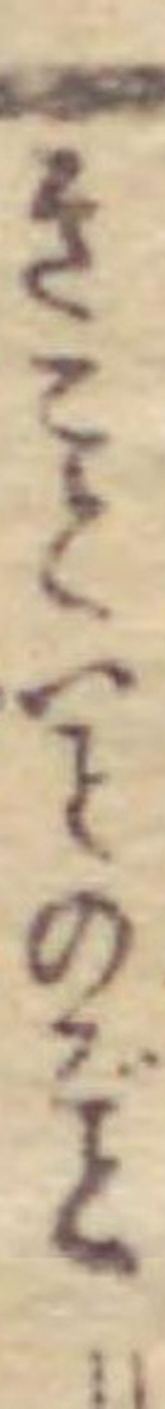きこといとのごと
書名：御誂染長寿小紋 : 3巻
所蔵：国立国会図書館 National Diet Library, JAPAN
